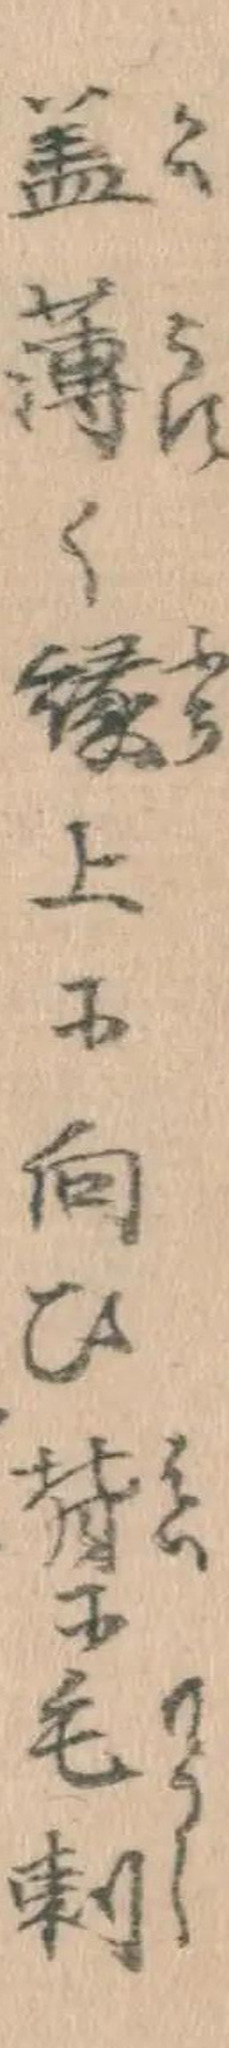蓋薄く縁上に向ひ背に毛刺
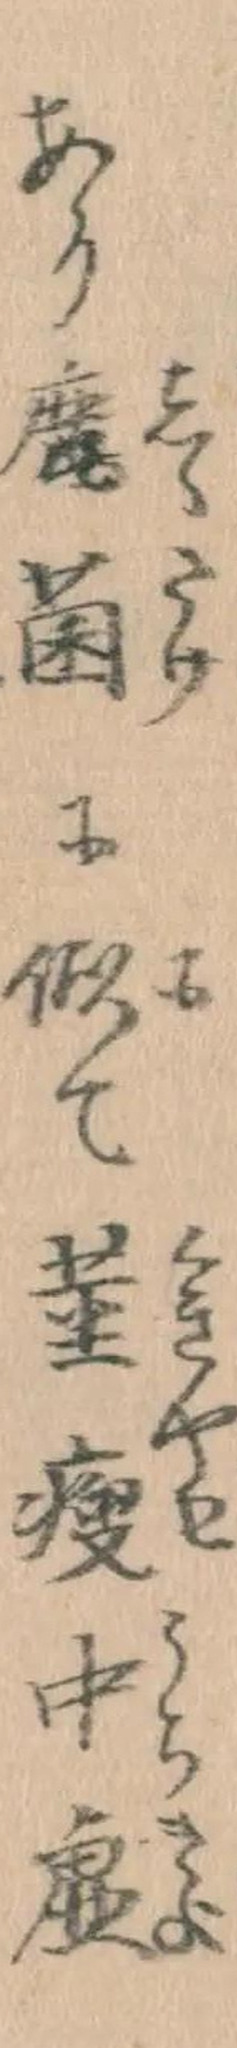あり鹿菌に似て茎痩中虚
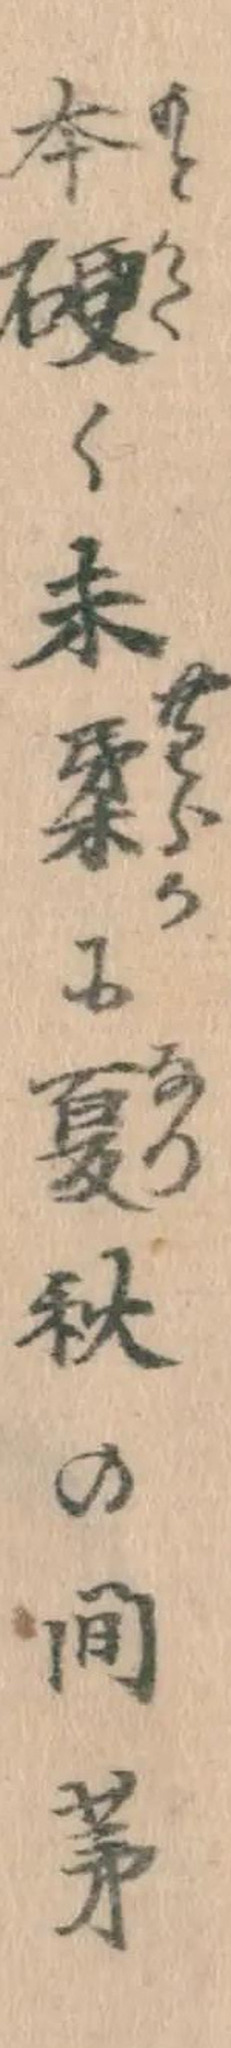本硬く末柔に夏秋の間茅
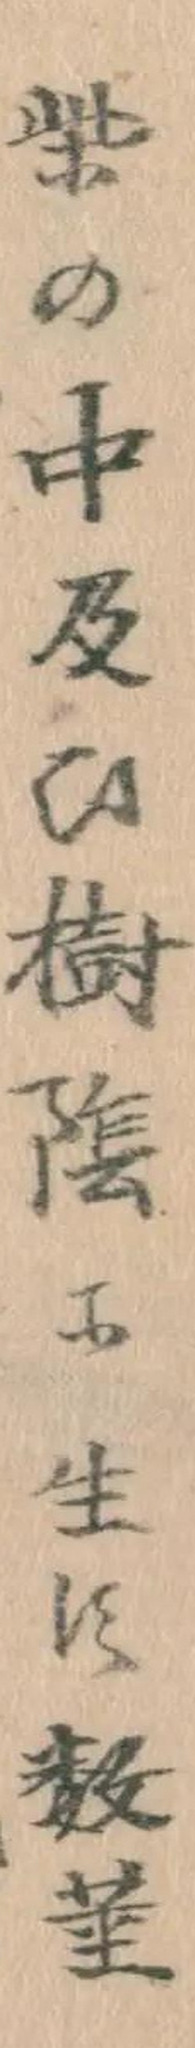柴の中及ひ樹陰に生す数茎
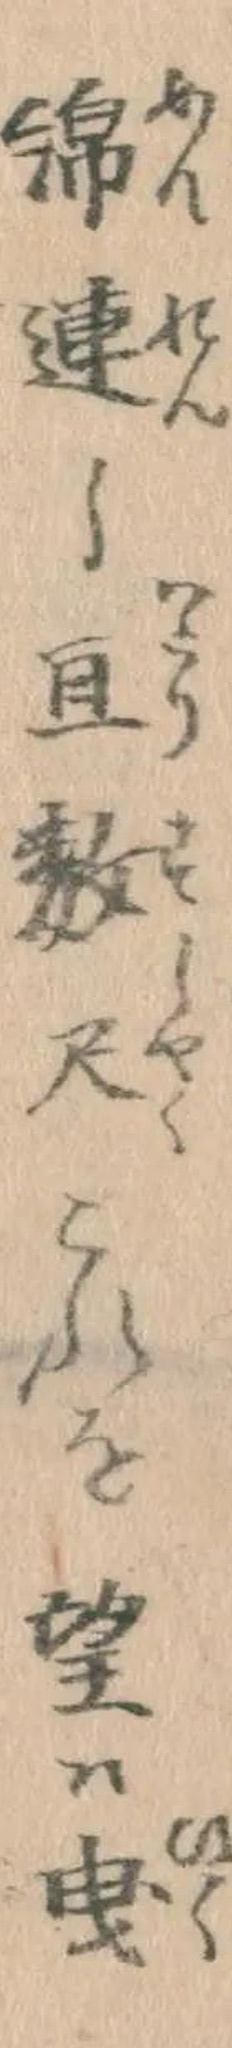綿連し亘数尺これを望は曳
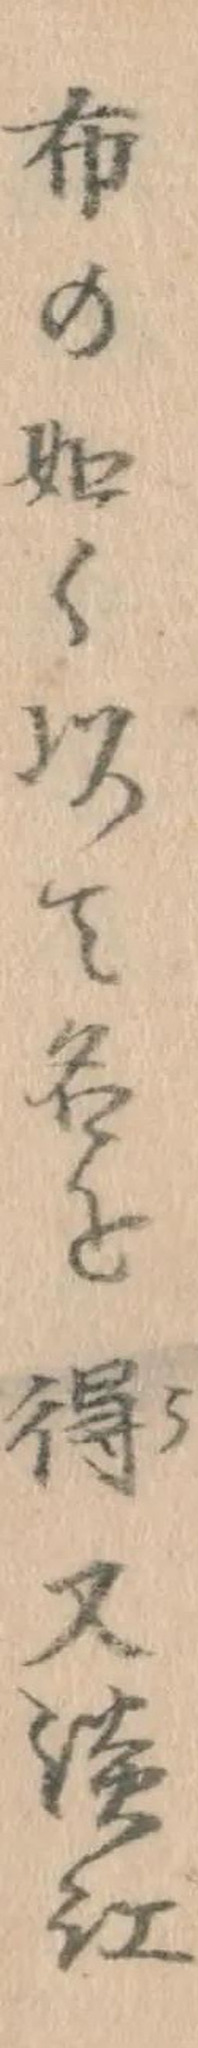布の如く以て名を得又淡紅
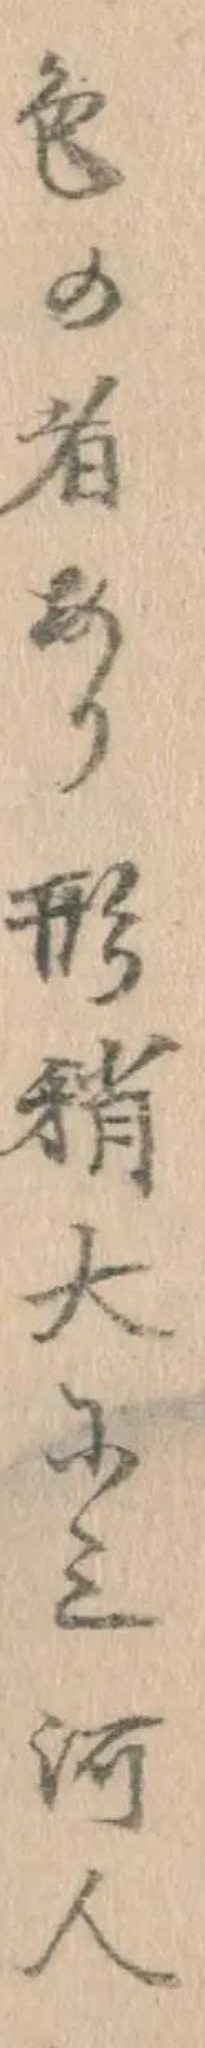色の者あり形稍大に三河人
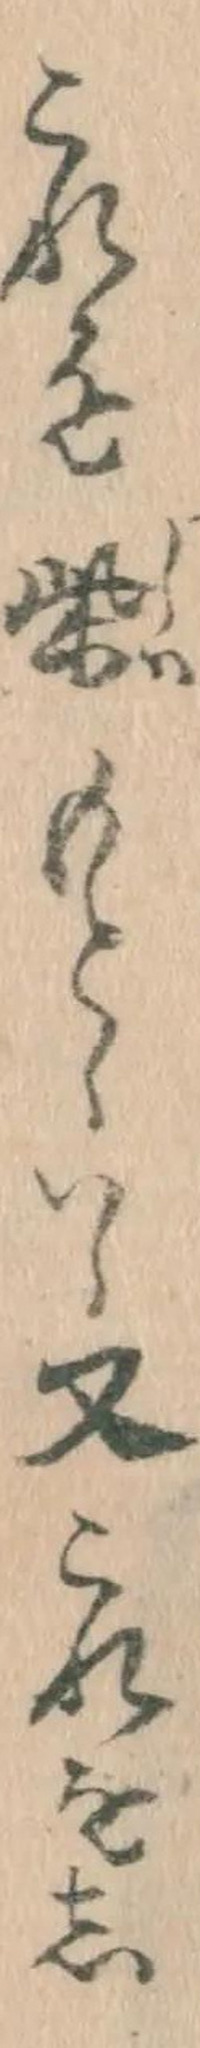これを柴もとゝいゝ又これをし
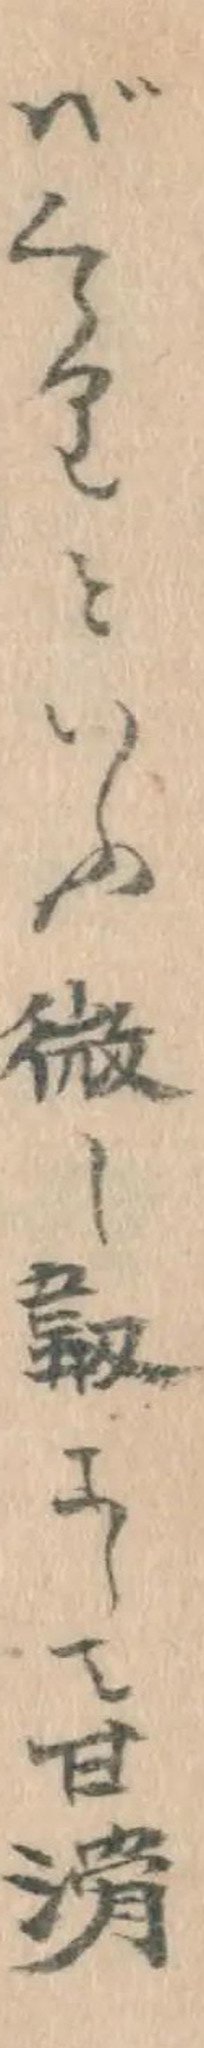ばくゝりといふ微し韌にして甘滑
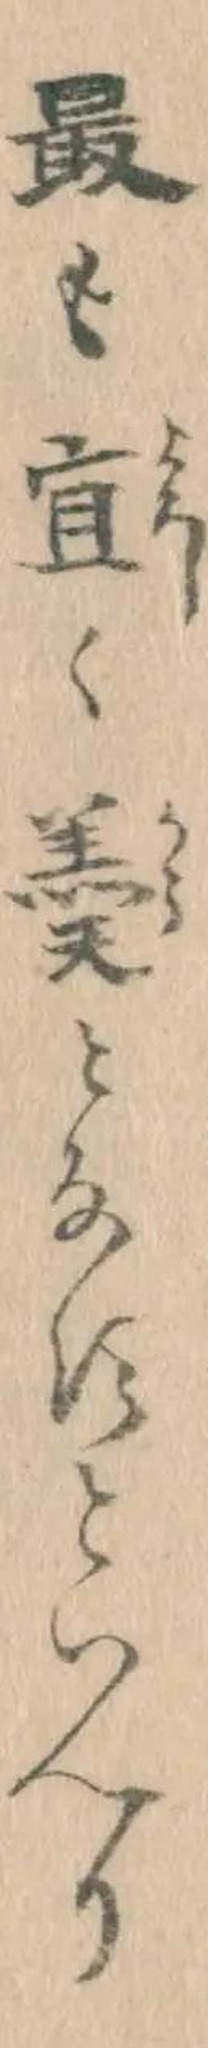最も宜く羹となすといへり

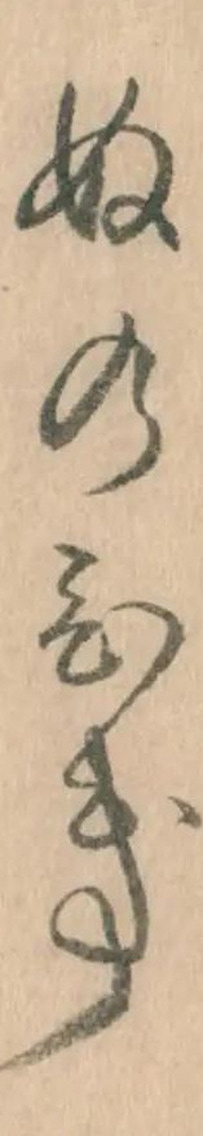ぬのひき
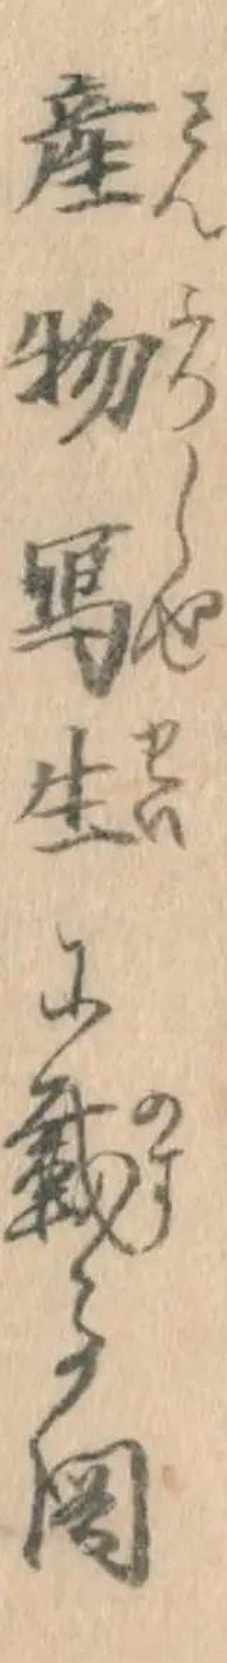産物写生に載る図
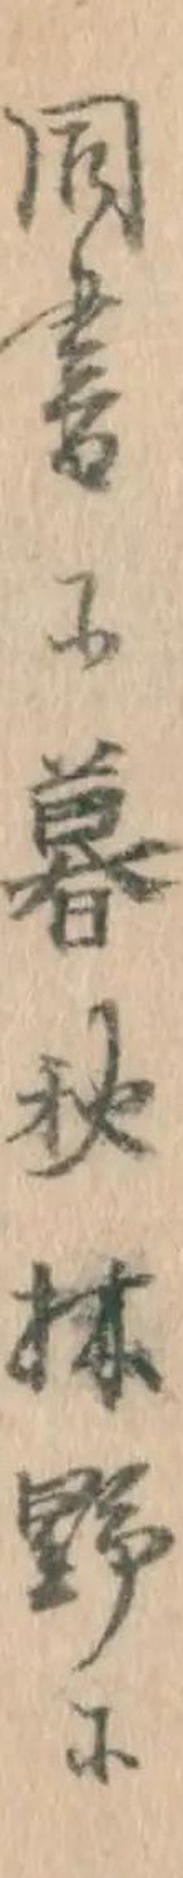同書に暮秋林野に
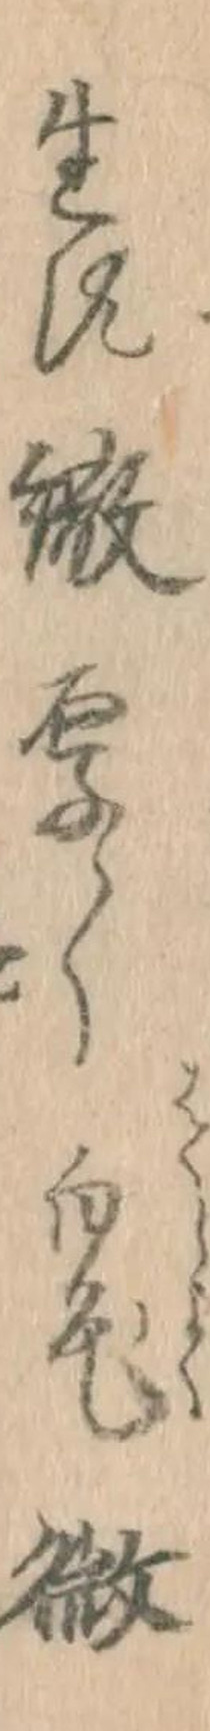生す繖厚く白色微
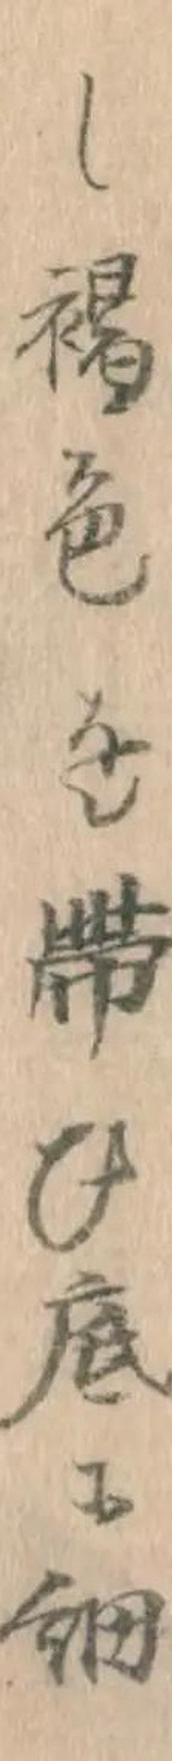し褐色を帯ひ底に細
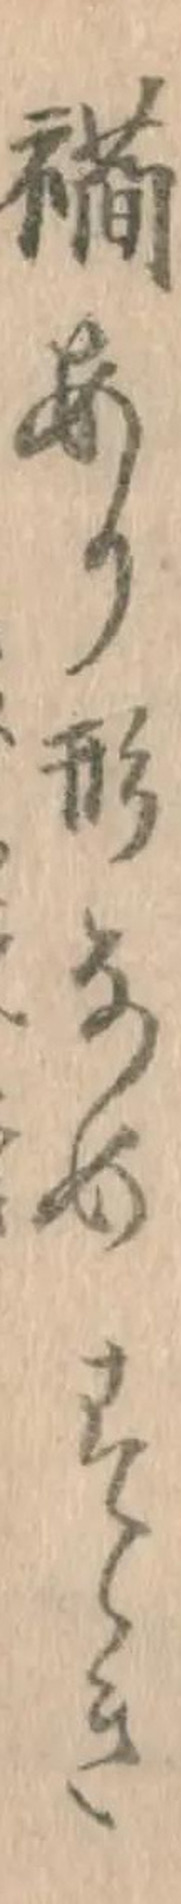あり形なめすゝき
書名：本草図譜. 巻58-60
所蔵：国立国会図書館 National Diet Library, JAPAN
